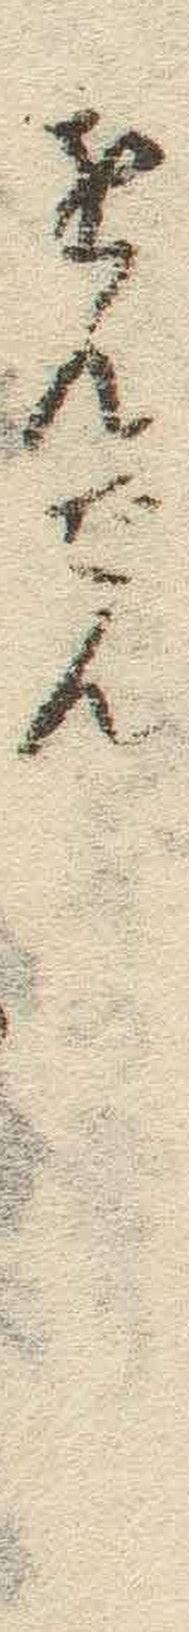をんでん
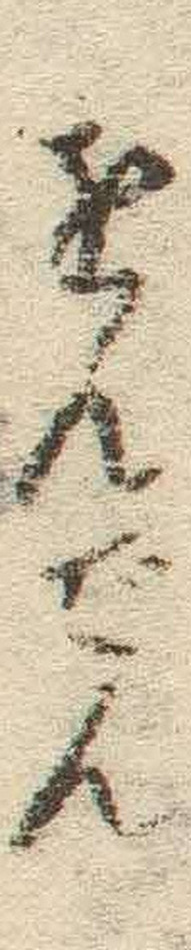をんでん
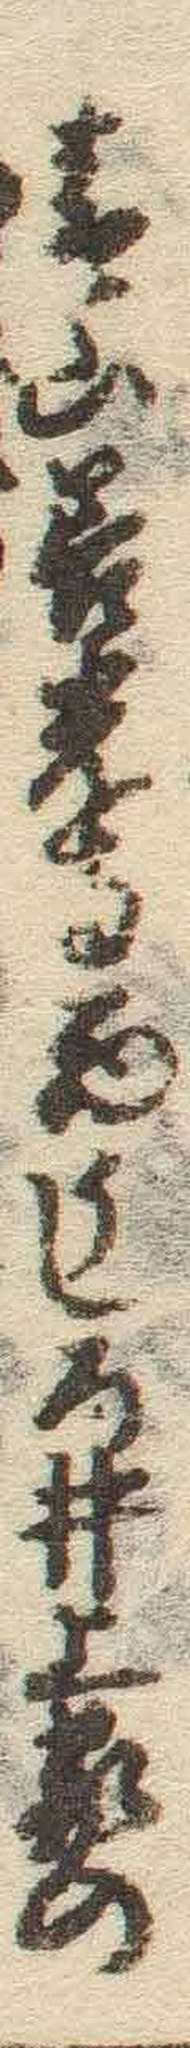青山善光寺西うしろ井上家の
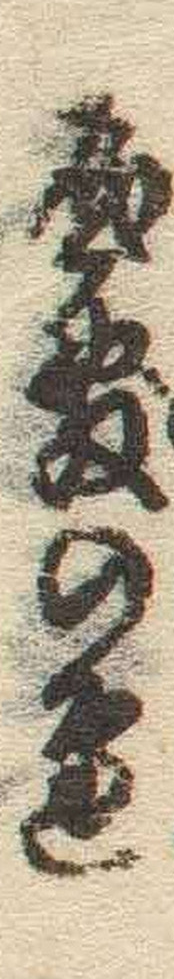屋敷の辺

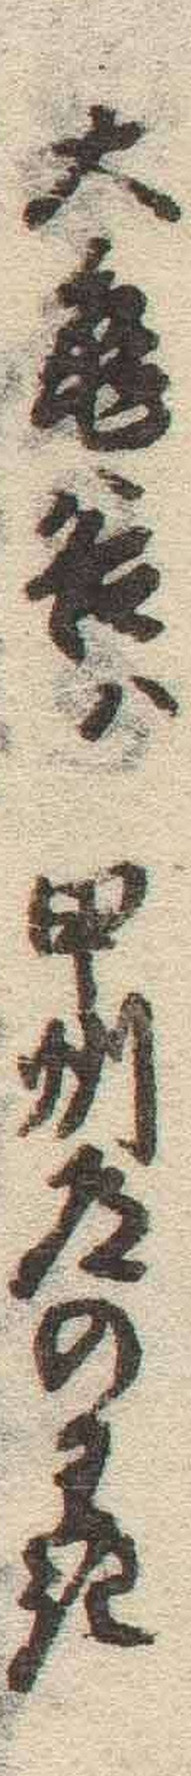大亀谷は甲州道のわき
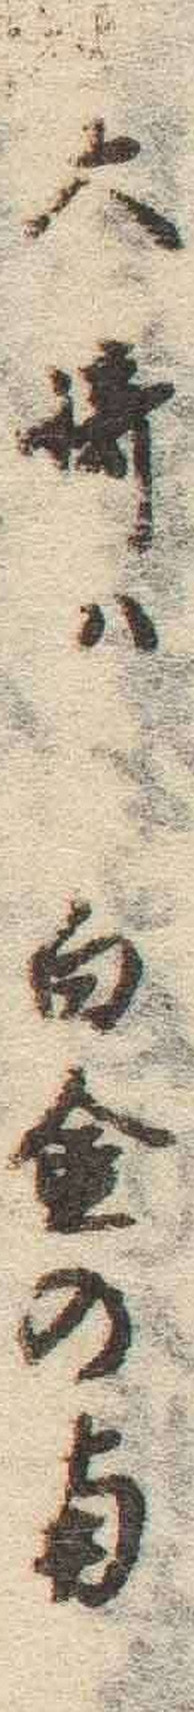大崎は白金の南
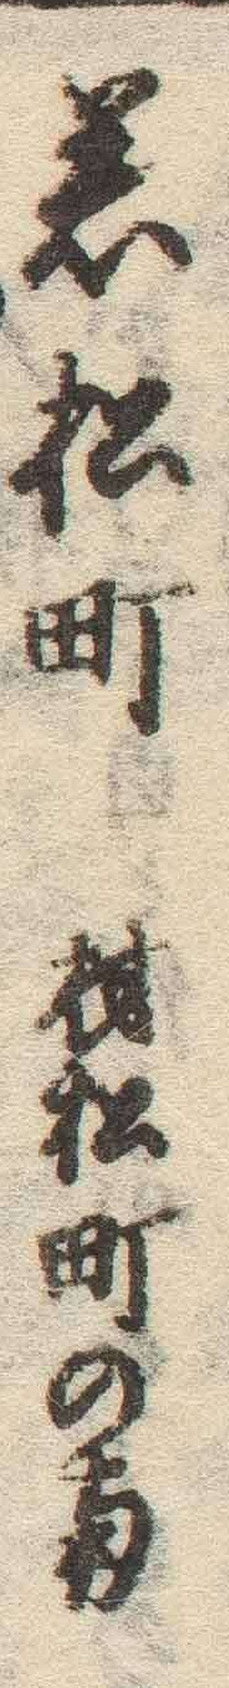若松町村松町の南
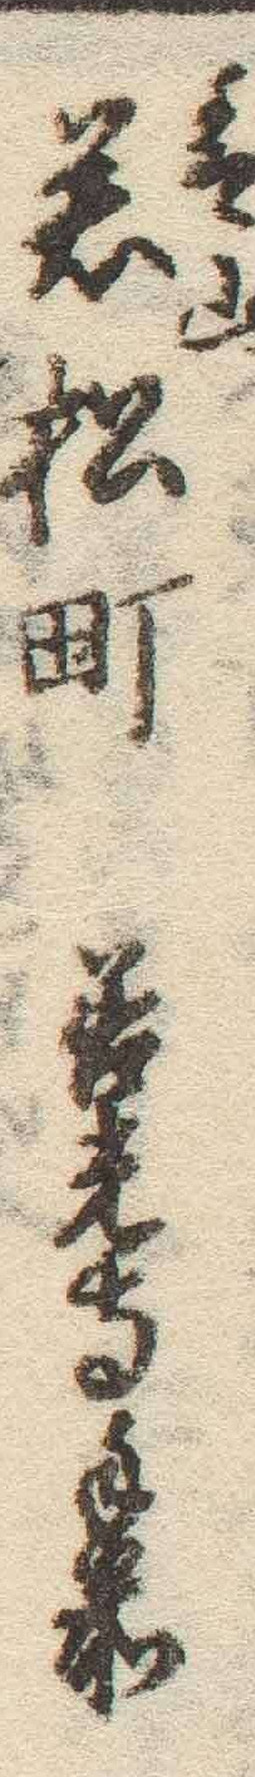若松町善光寺手前
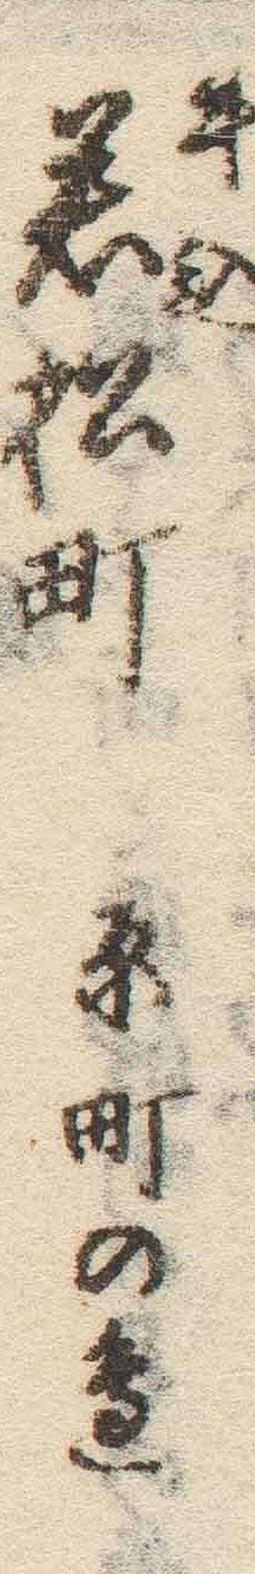若松町原町の辺
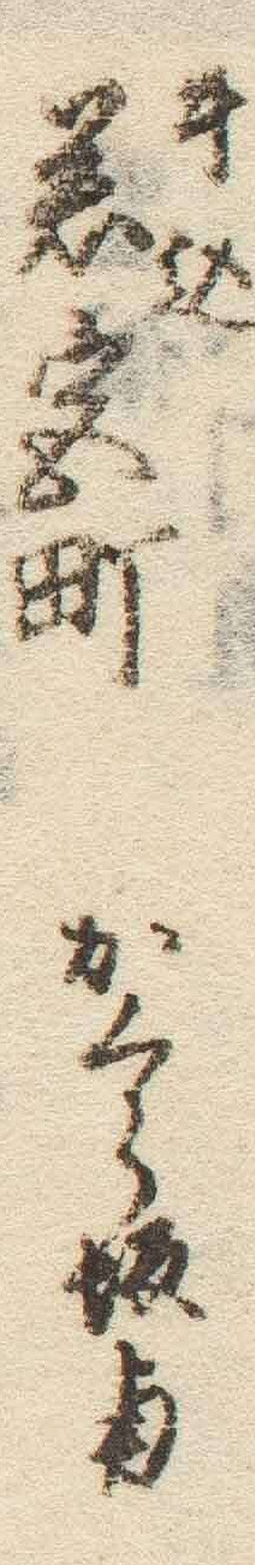若宮町かくら坂南
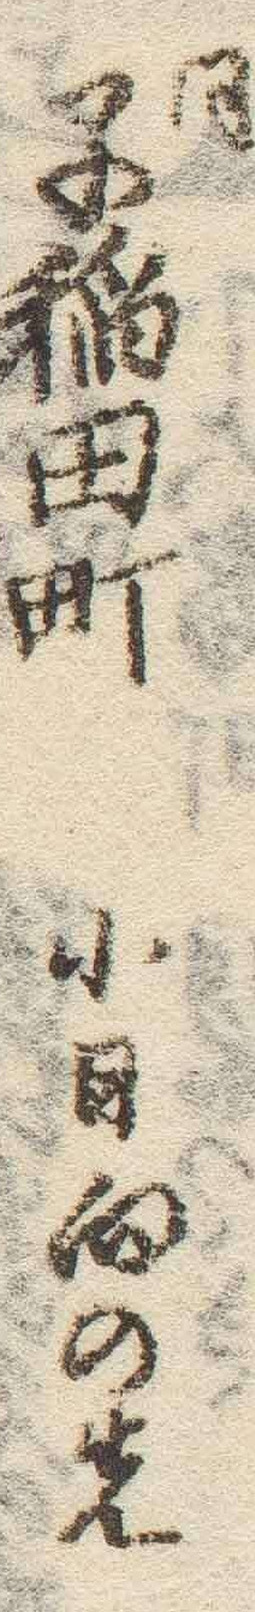早稲田町小日向の先
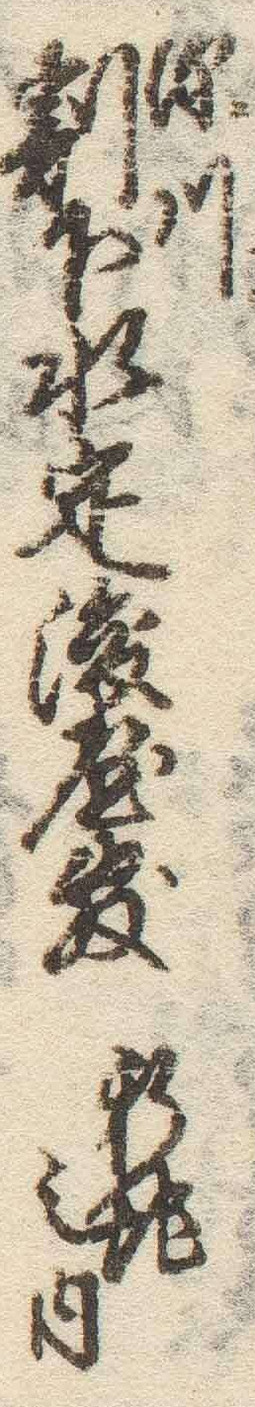割下水定浚屋敷新地
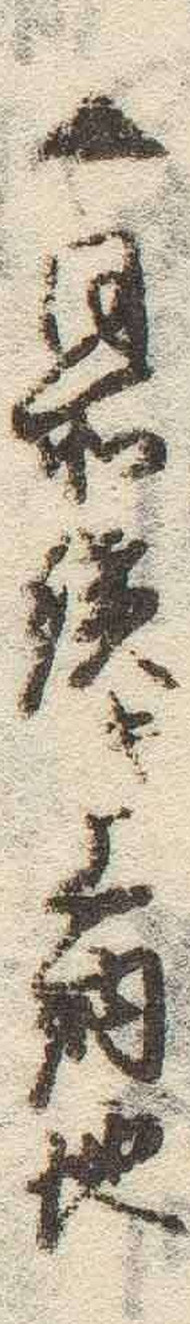▲同所続き上納地
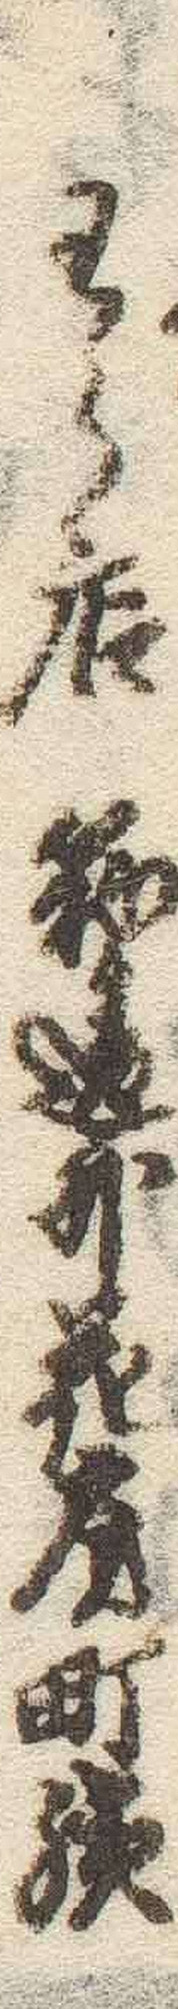わら店筋違外花房町続
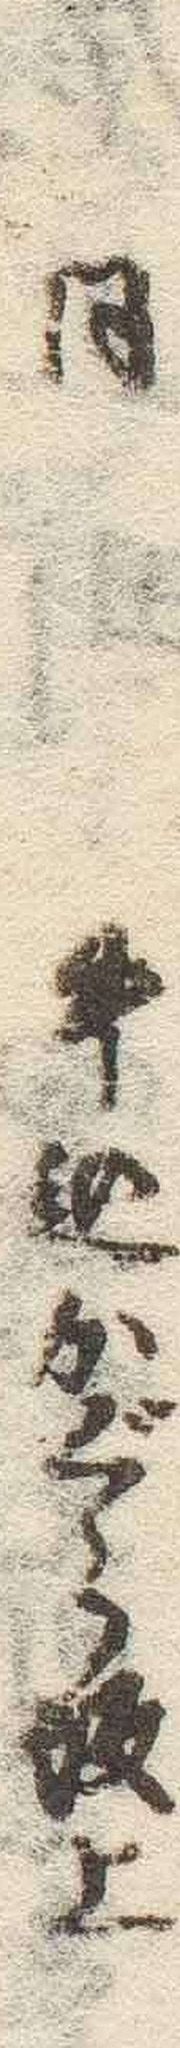同牛込かぐら坂上
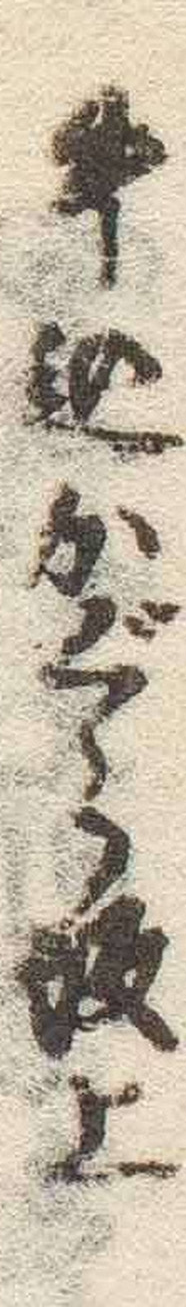同牛込かぐら坂上
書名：江戸町独案内
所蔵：東京学芸大学附属図書館 国文学研究資料館
